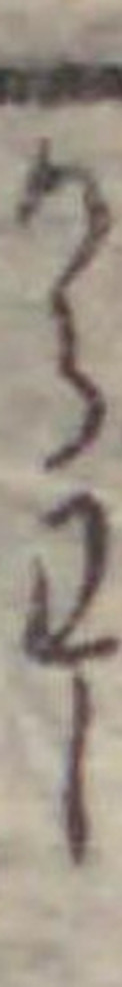からわし
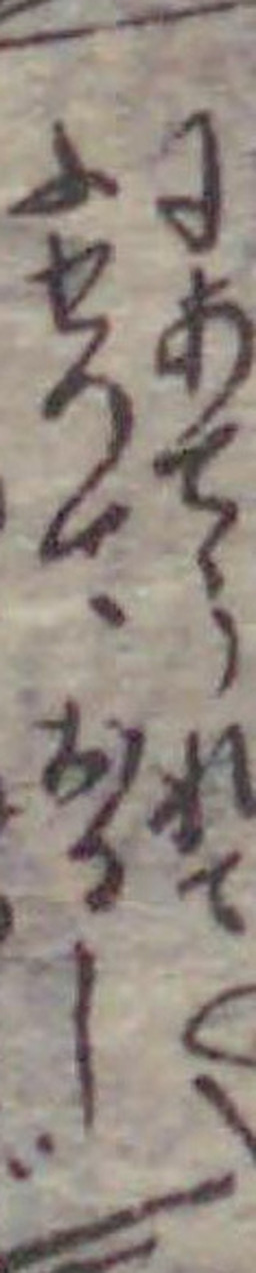ふせつておるし
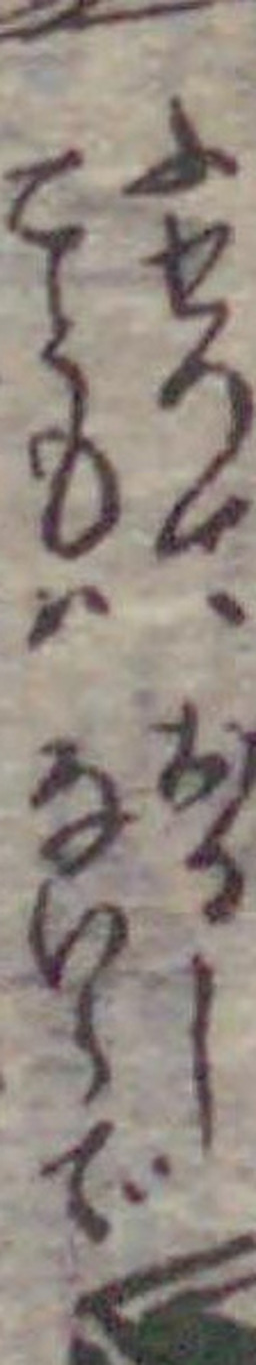こともはないしで
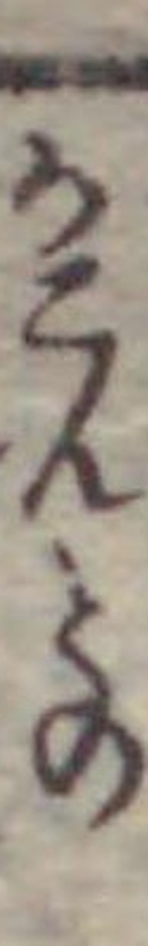かこんとの
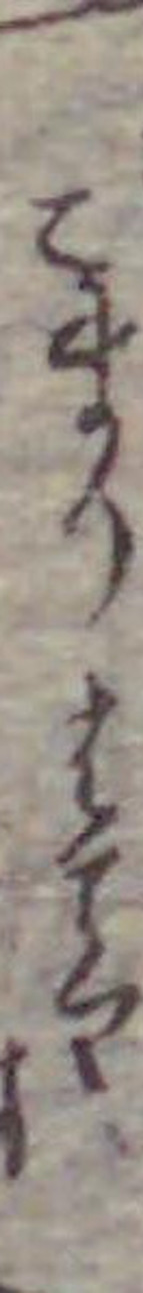こまりはてや
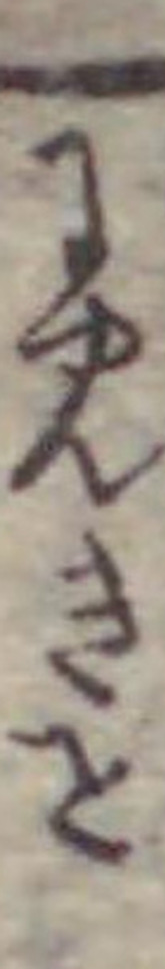にやんきを
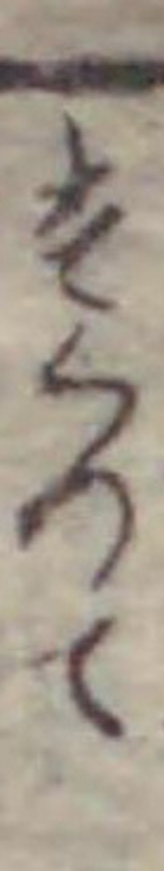すくつて
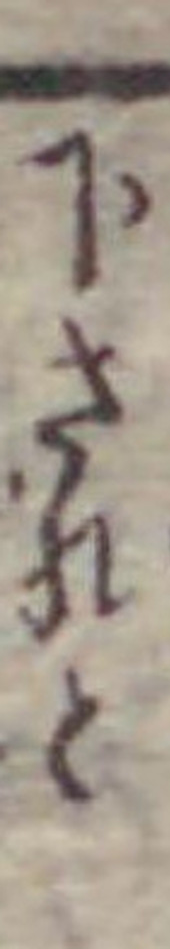下されと
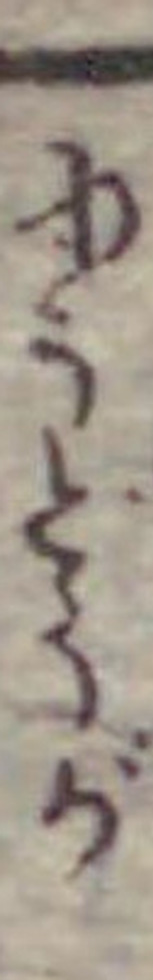にうどうが
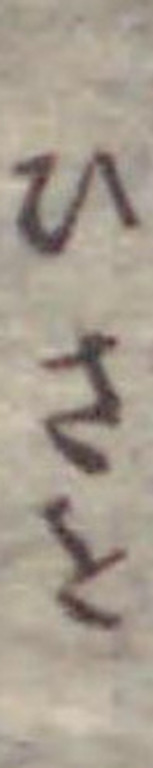ひさを
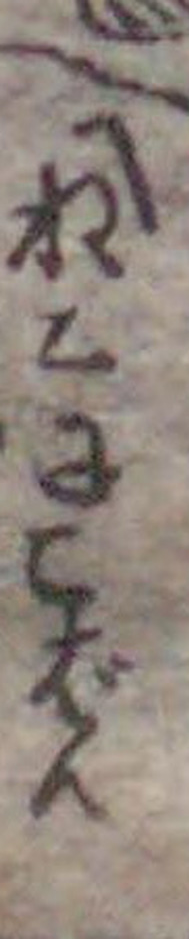〽ねこにこばん
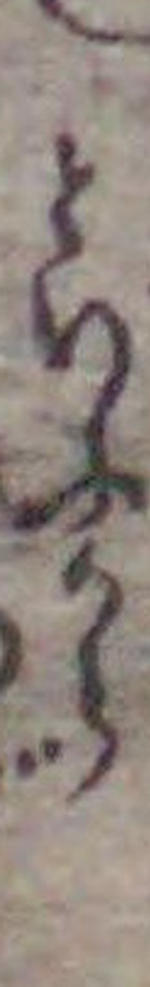といふから
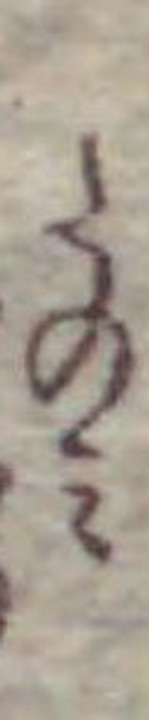たのみ
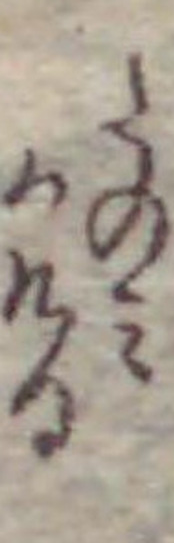たのみ
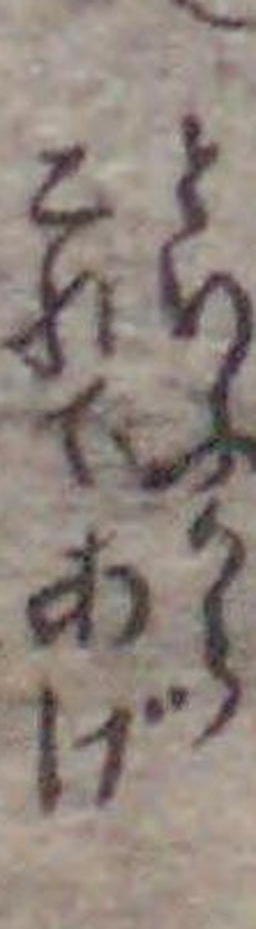これであげ
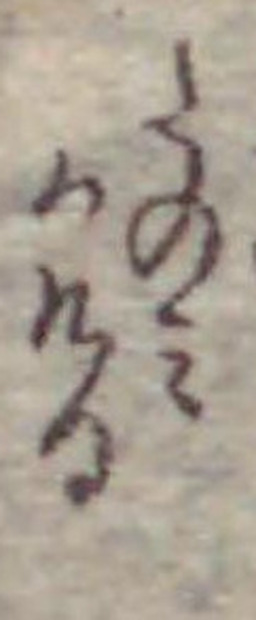かける
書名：化物見世開 : 2巻
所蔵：国立国会図書館 National Diet Library, JAPAN
